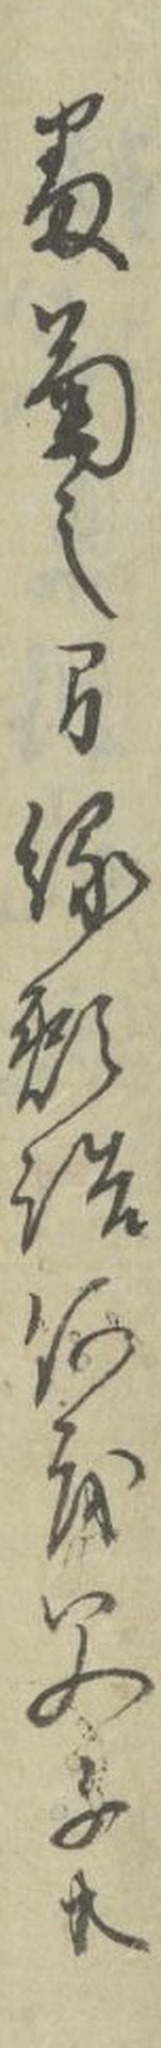番菊之間縁頬詰何も父子共
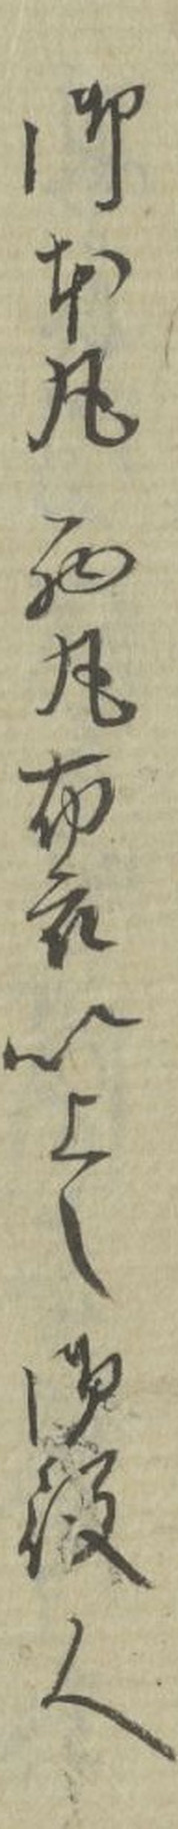御本丸西丸布衣以上之御役人
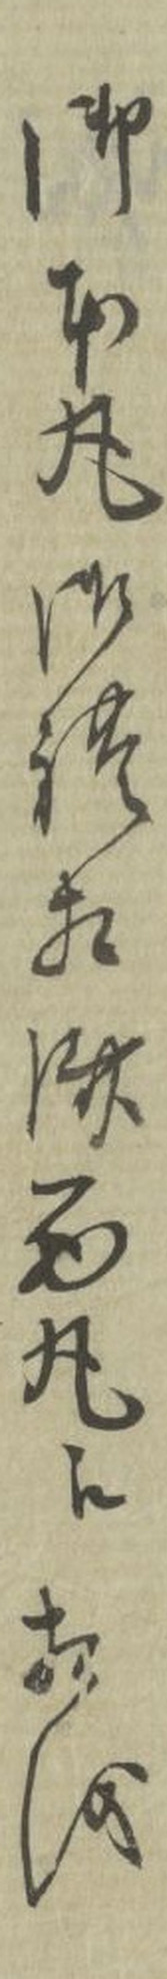御本丸御礼相済西丸え相越
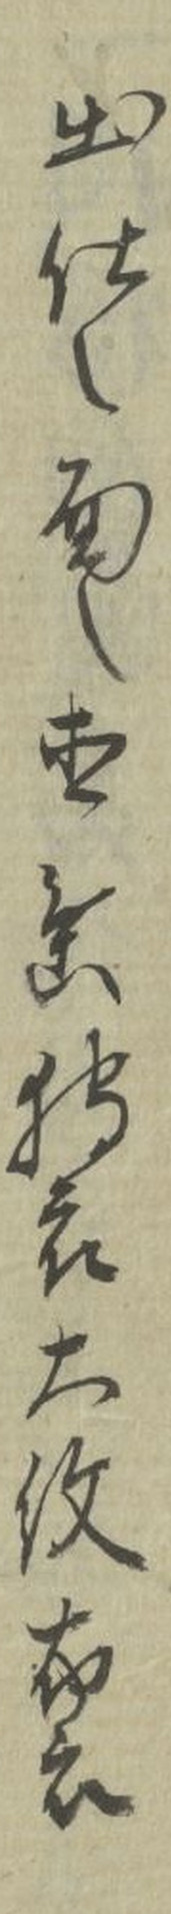出仕之面之直垂狩衣大紋布衣
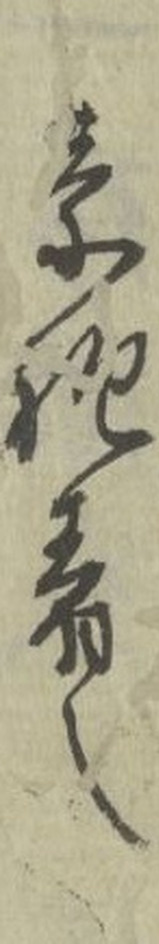素袍着之

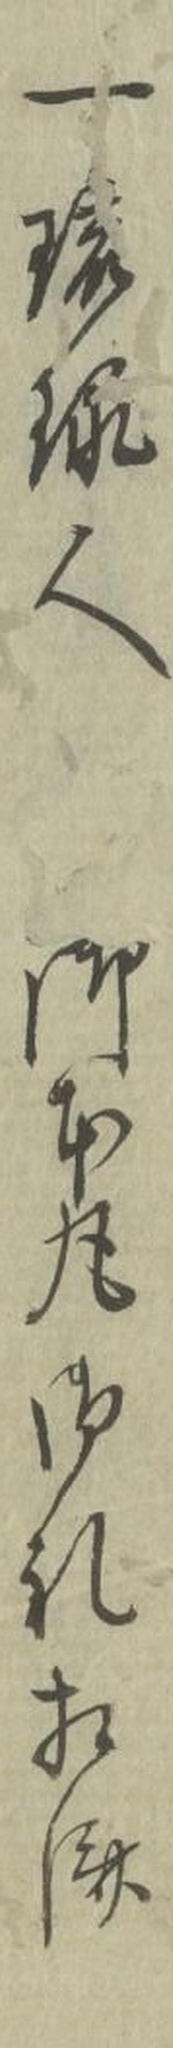一琉球人御本丸御礼相済
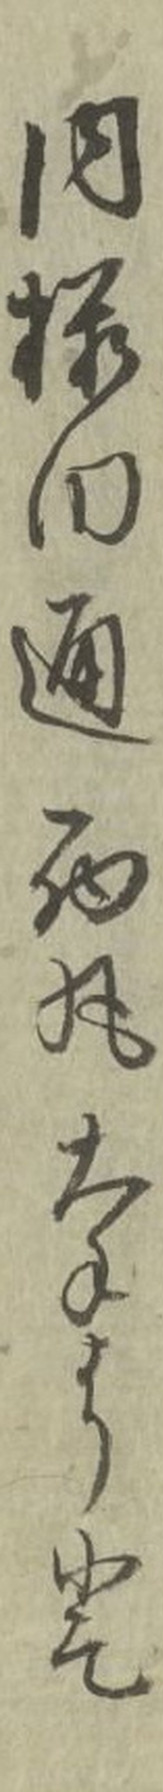内桜田通西丸大手より登
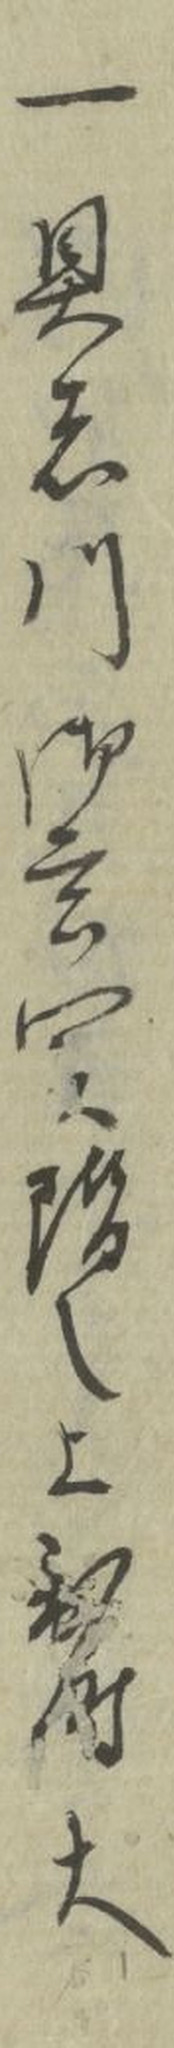一具志川御玄関階之上到時大
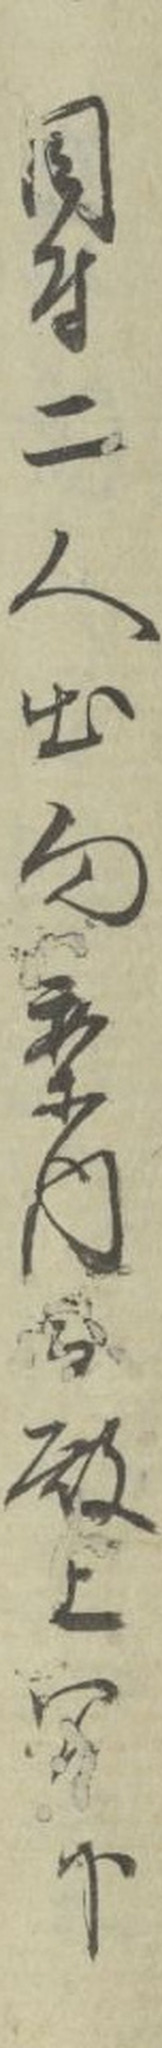目付二人出向案内而殿上間下
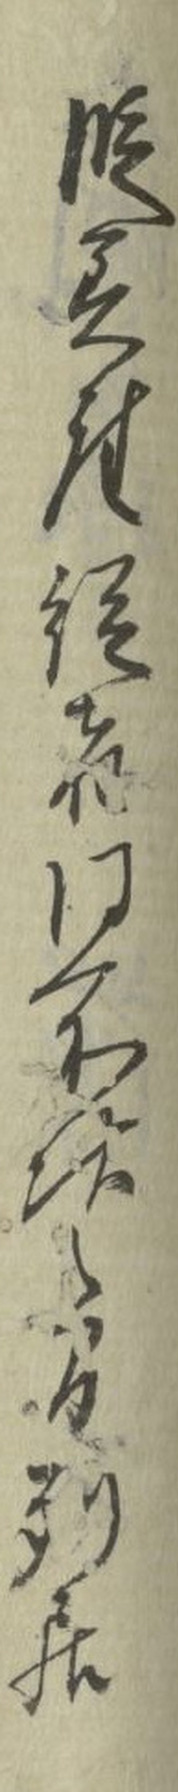段着座従者同所次之間列居
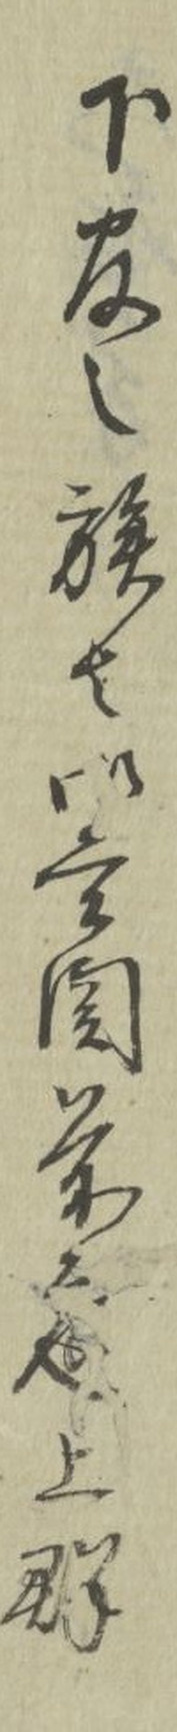下官之族は御玄関前庭上群
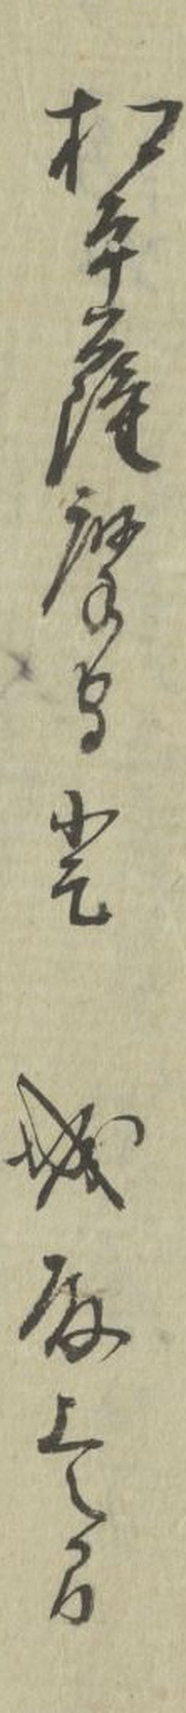一松平薩摩守登城殿上之間
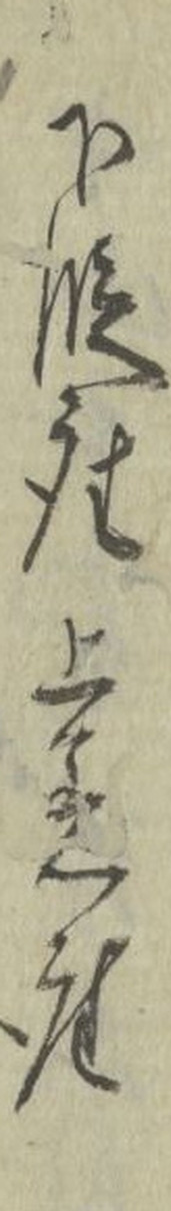下段座上着座

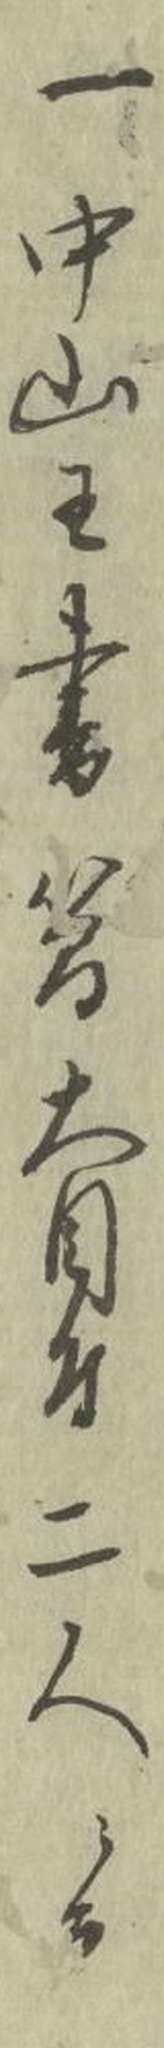一中山王書簡大目付二人に而
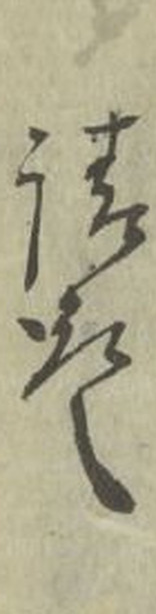請取之
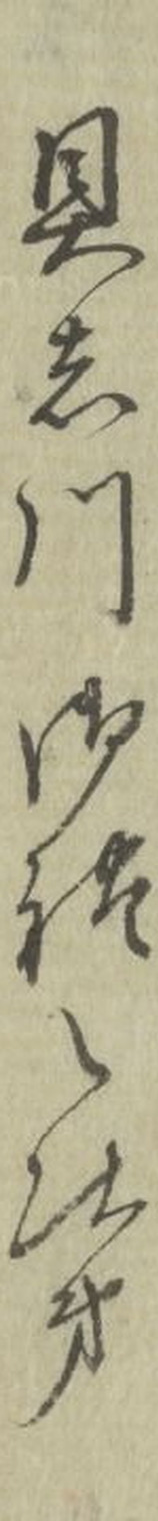具志川御礼之次第
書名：琉球来朝記 自八至十四終
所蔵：University of the Ryukyus Library
